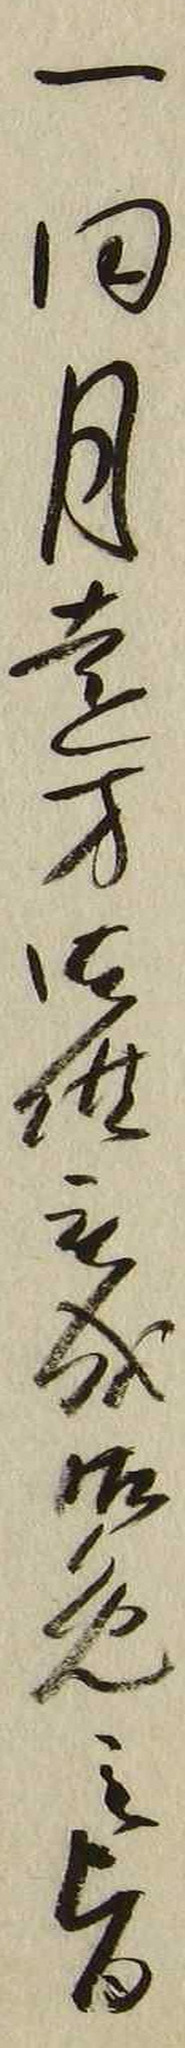一同月遠方御供被成御免之旨
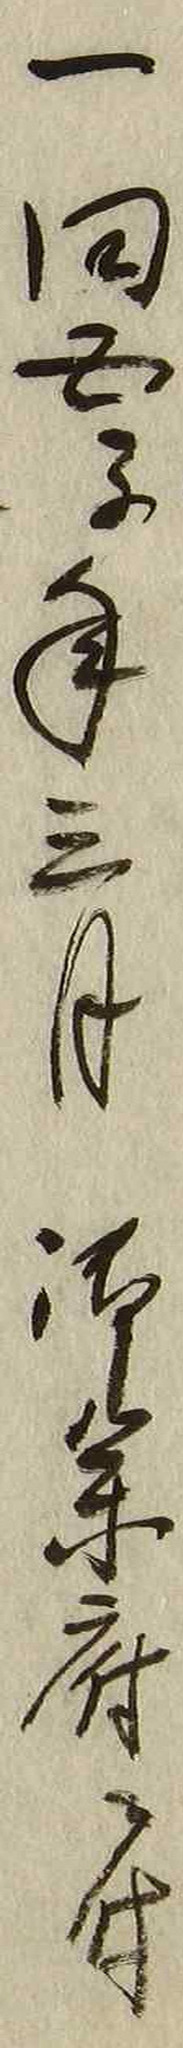一同五子年三月御参府ニ付
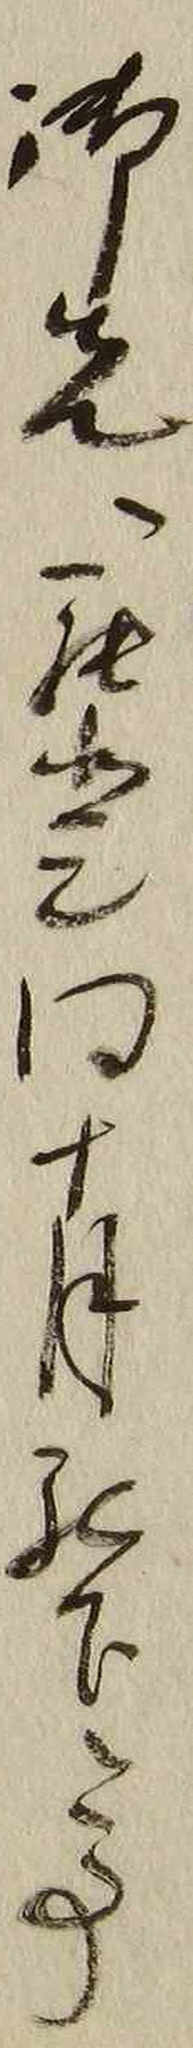御先へ罷登同十月罷下候事
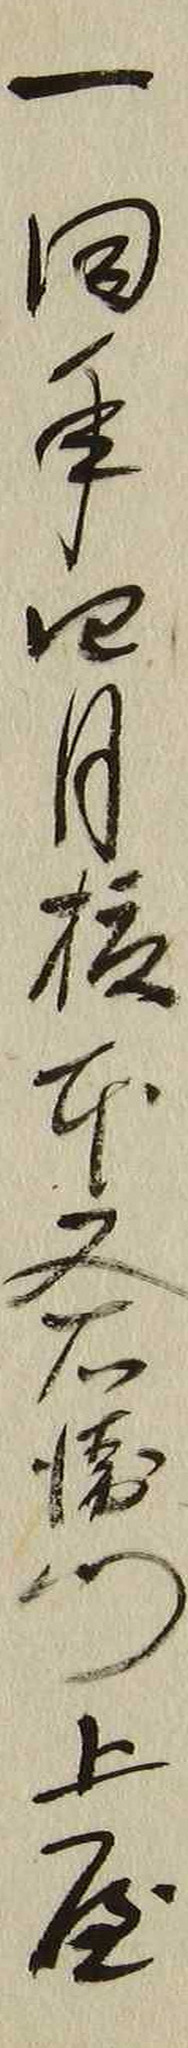一同年四月榎本又右衛門上屋
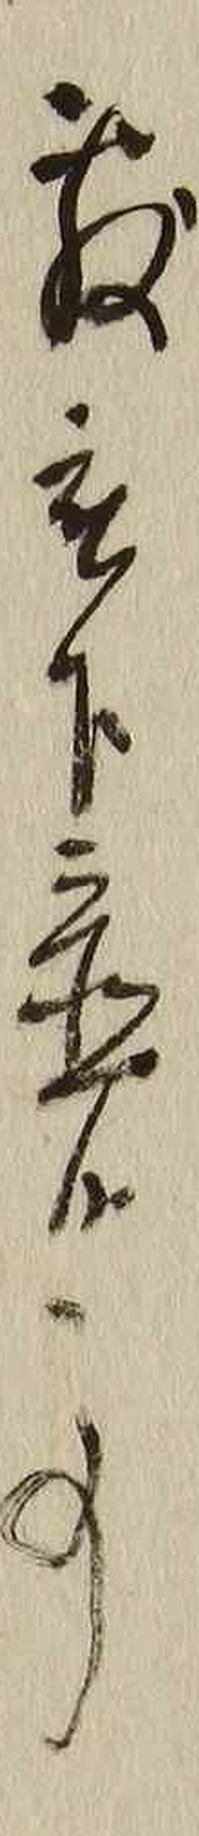敷被下置候事
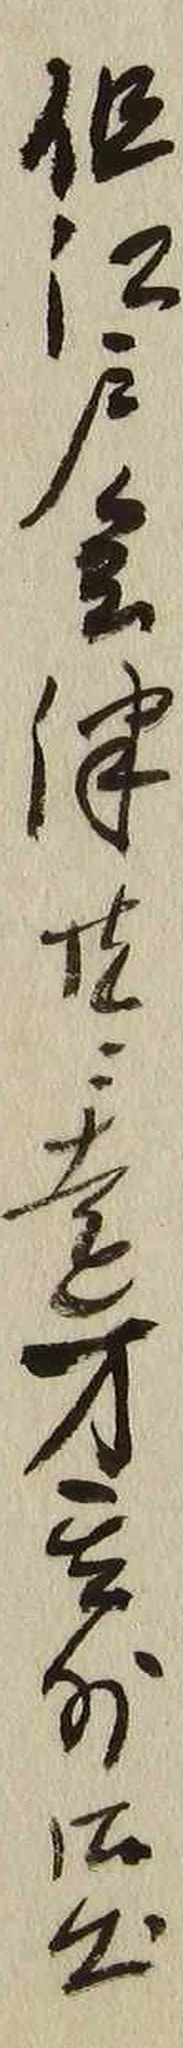但江戸会津共ニ遠方其外御出
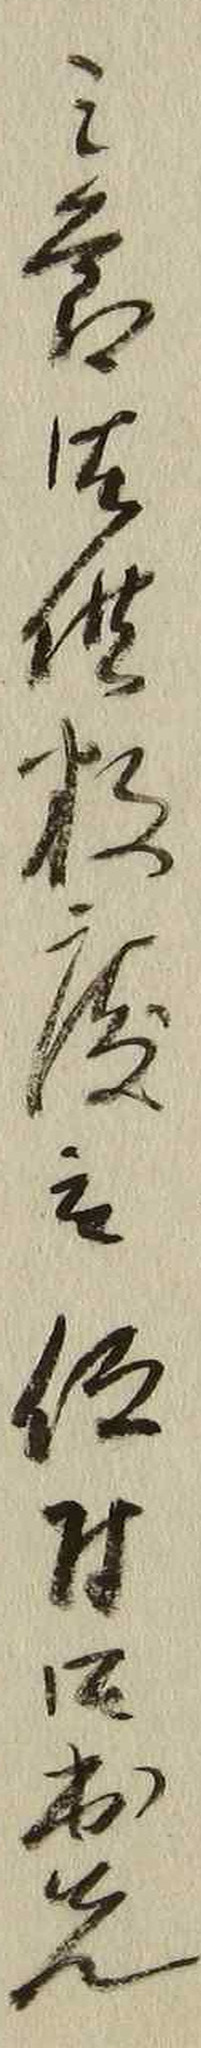之節御供数度被仰付御出先
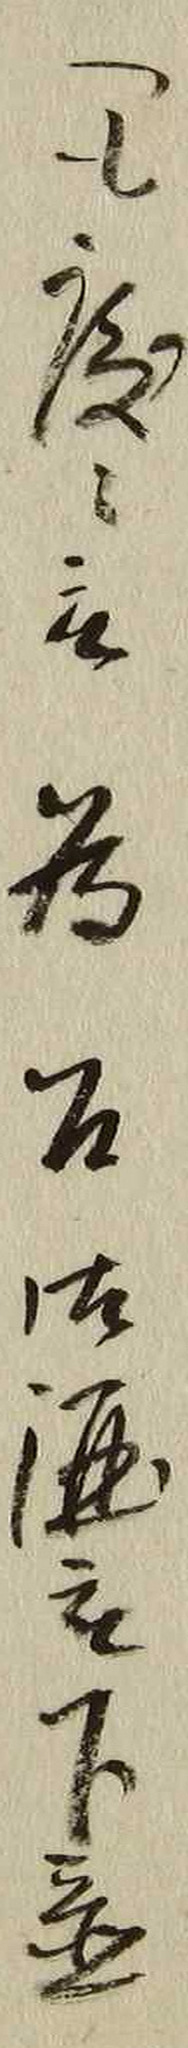へも度々被為召御酒被下置
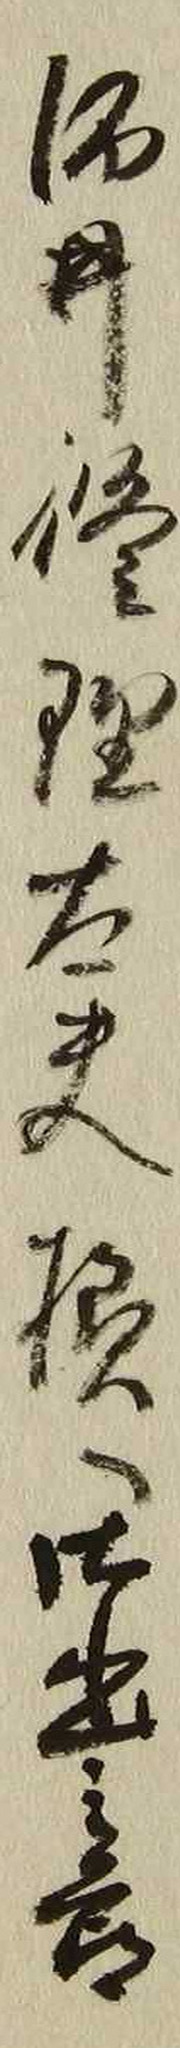酒井修理太夫様へ御出之節
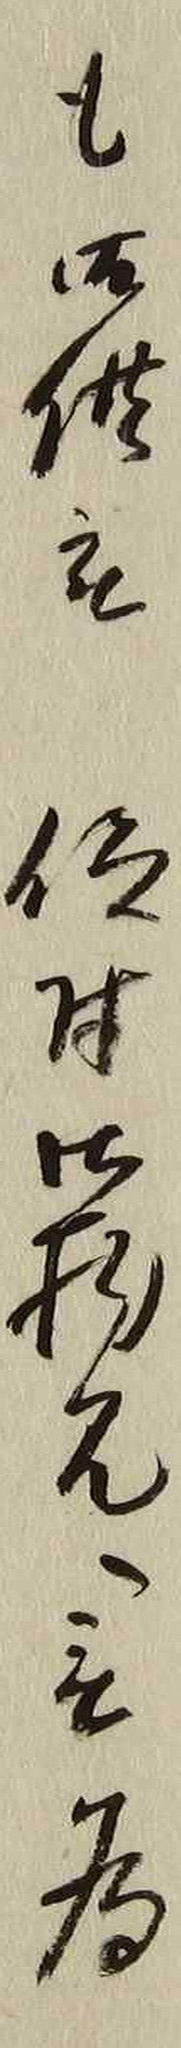も御供被仰付御物見へ被為
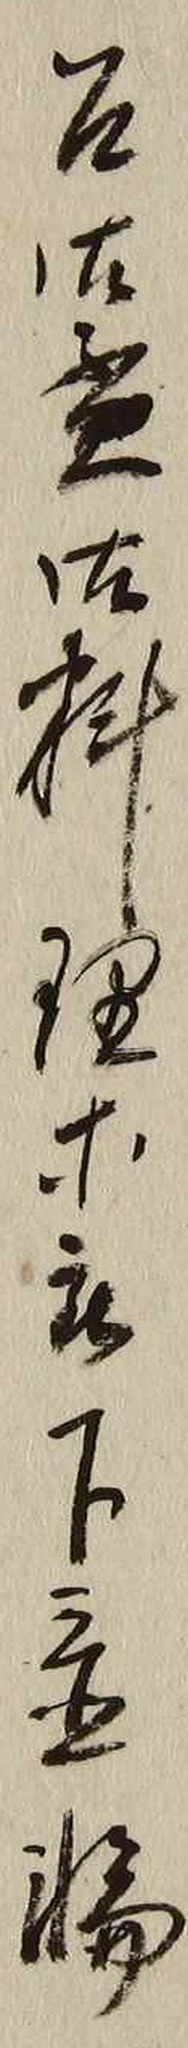召御盃御科理等被下置輪
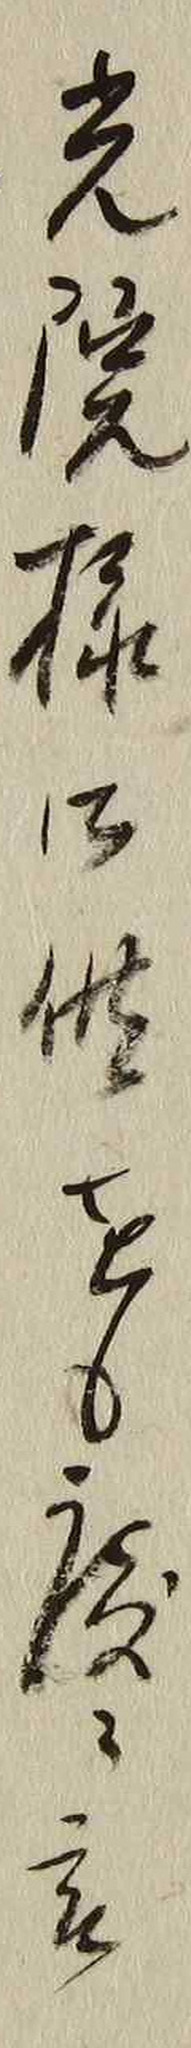光院様御供をも度々被
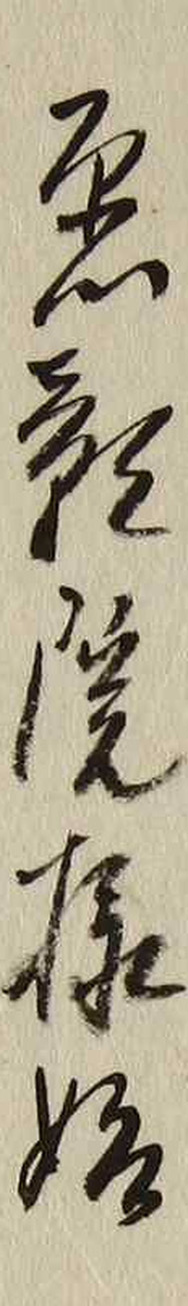愿彰院様始
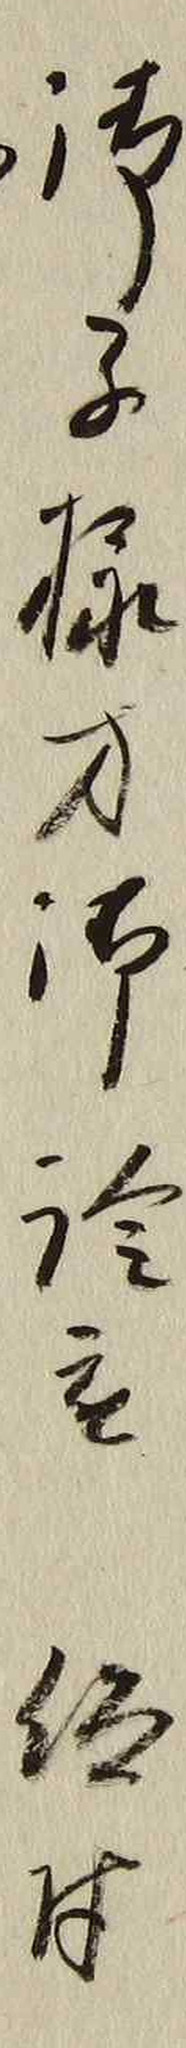御子様方御診被仰付
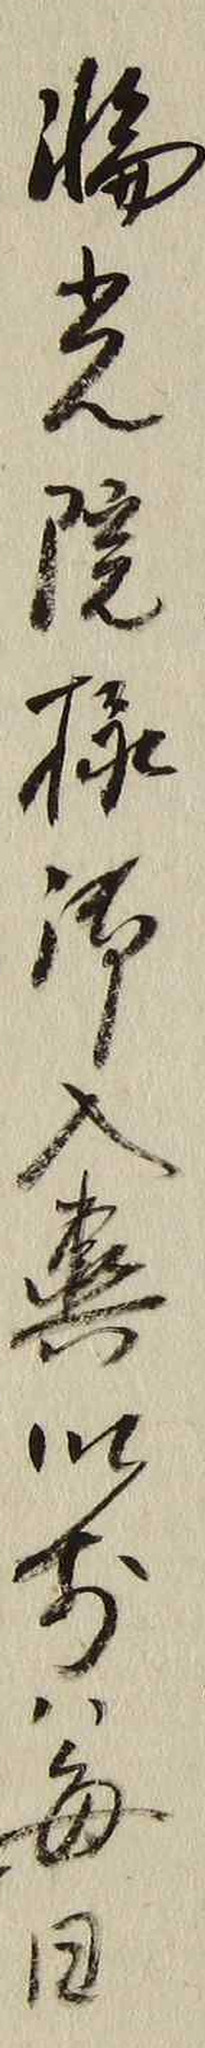輪光院様御入輿以前ハ毎日
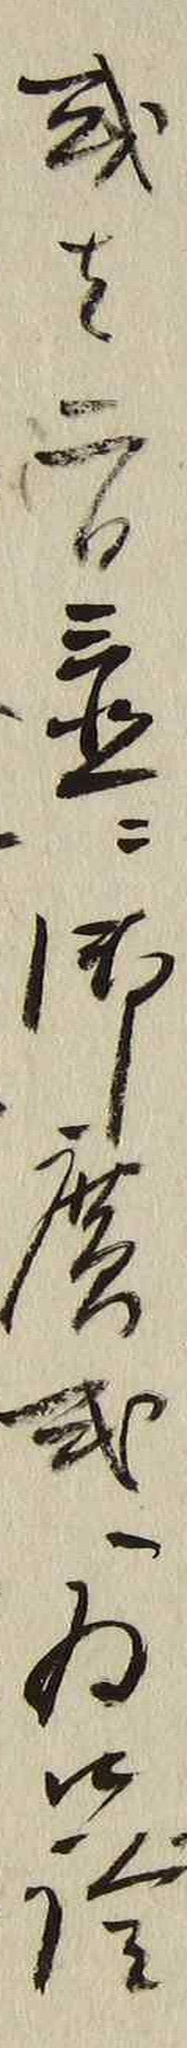或者二日置ニ御広式へ為御診
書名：諸士系譜　巻之353　す之部3
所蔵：会津若松市立会津図書館
